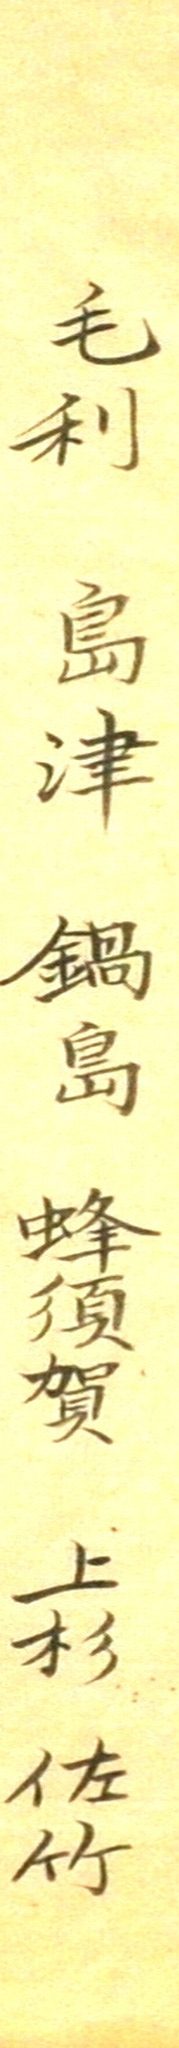毛利島津鍋島蜂須賀上杉佐竹
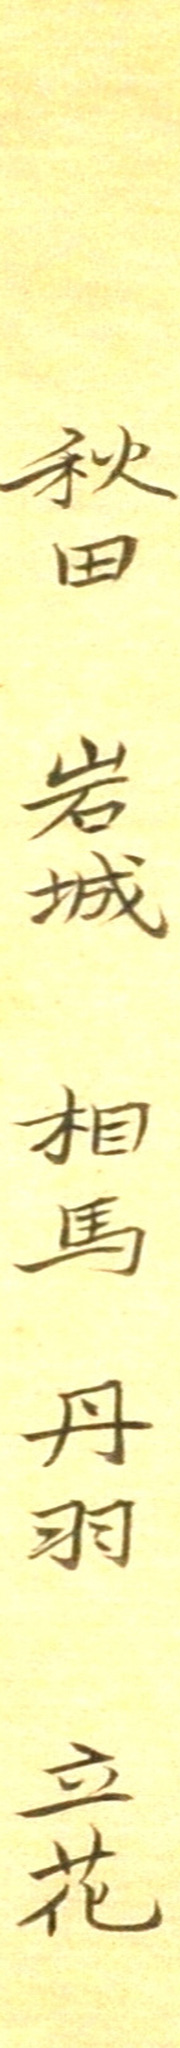秋田岩城相馬丹羽立花
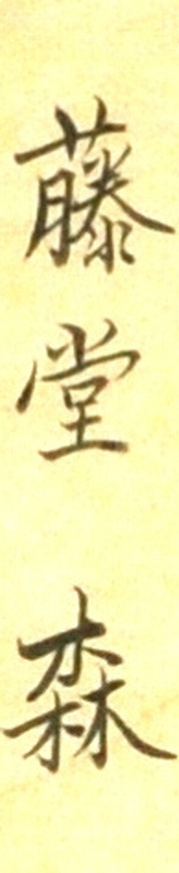藤堂森
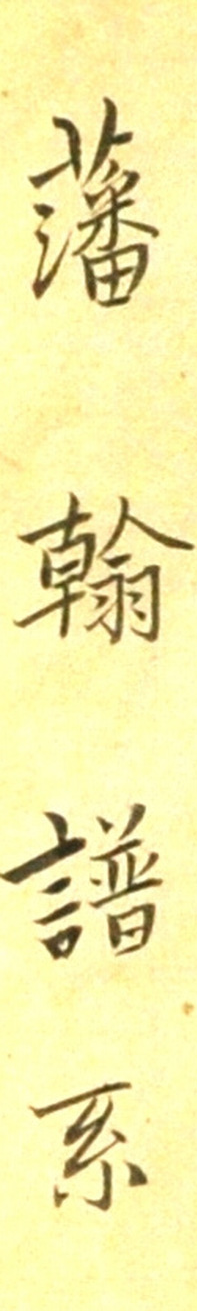藩翰譜系
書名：藩翰譜系（一）
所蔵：伊那市立高遠町図書館・合同会社AMANE
